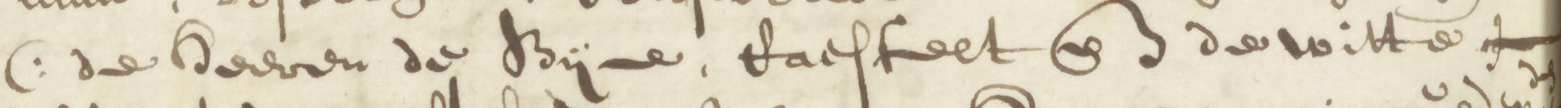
(:de Heeren de Bije, Raesfelt & de witte te
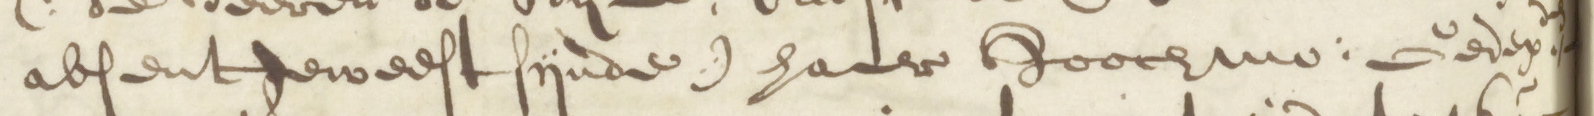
absent geweest sijnde:) haer Hoochmo: Gedepen.
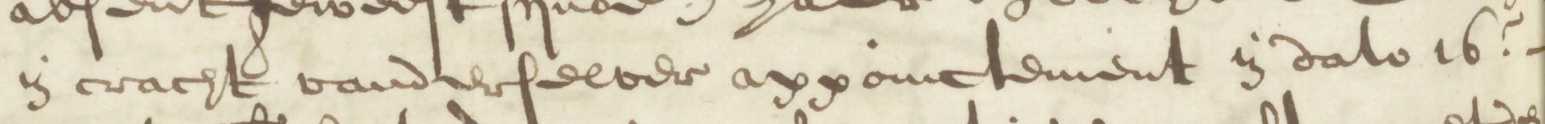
in cracht vanderselver appoinctement in dato 16e.
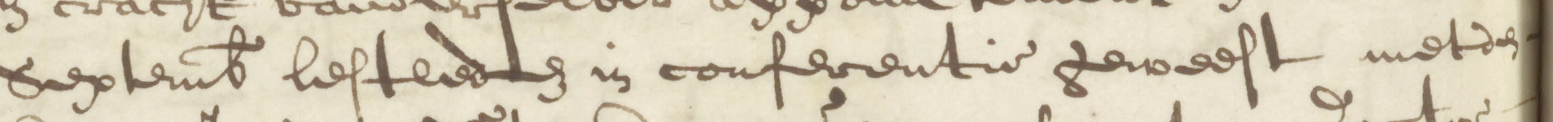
Septemb lestleden in conferentie geweest met den
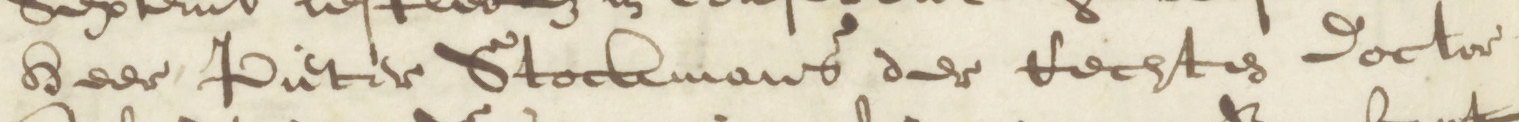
Heer Pieter Stockmans der Rechten Doctor
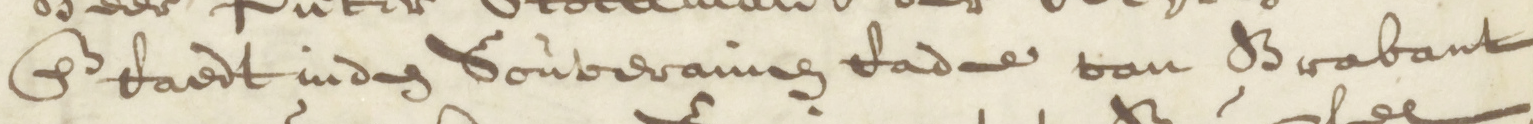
& Raedt inden Souverainen Rade van Brabant
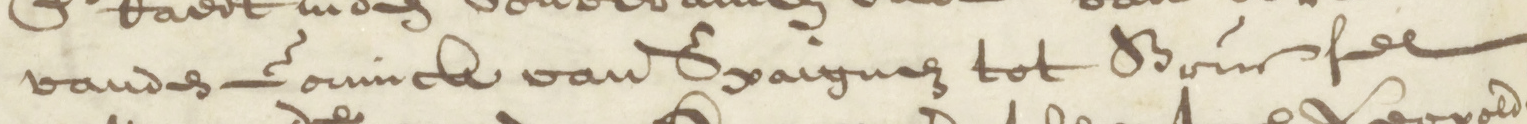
vanden Coninck van Spaignen tot Brusssel
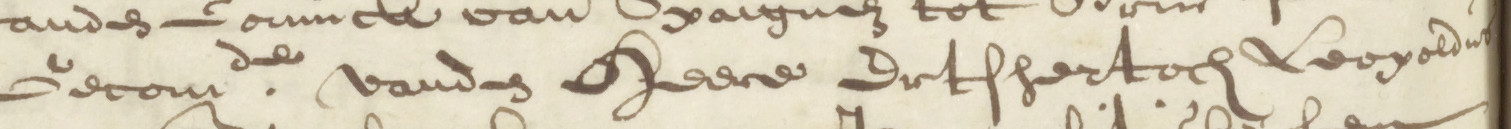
Gecomde. vanden Heere Ertshertoch Leopoldus
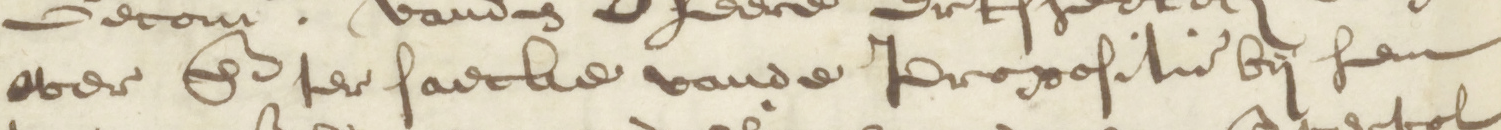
over & ter saecke vande Propositie bij hem
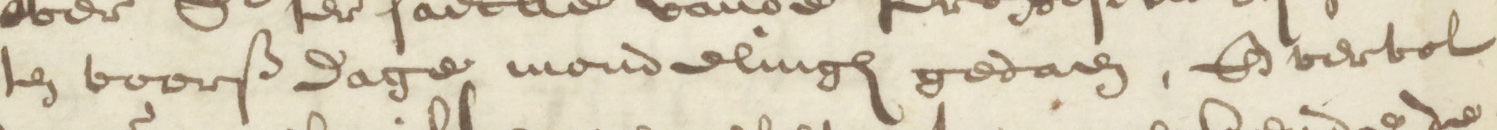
ten voors Dage mondelingh gedaen, & vervol„
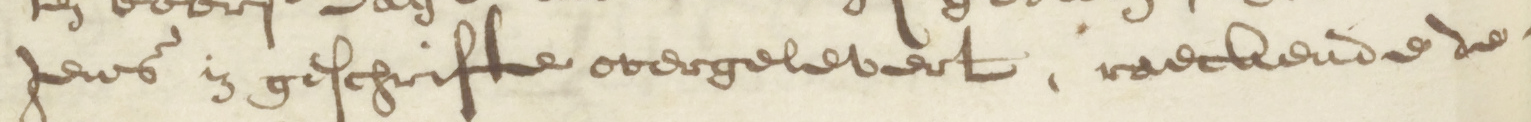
gens in geschrifte overgelevert, raeckende de
